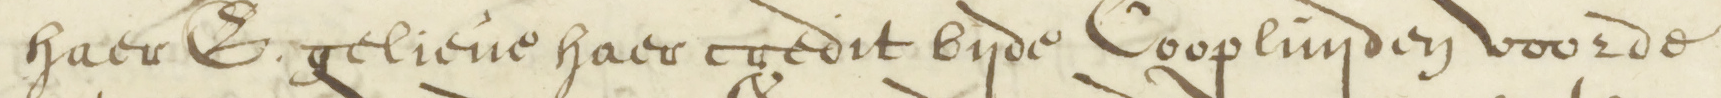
haer E. gelieve haer credit bijde Coopluyden voor de
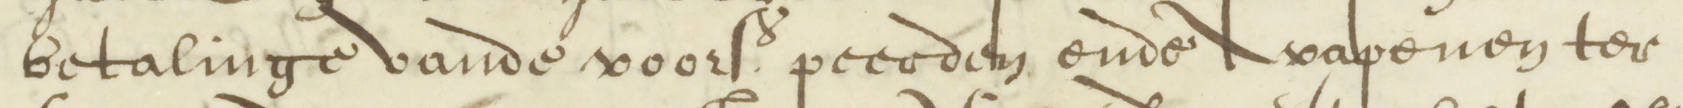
betalinge vande voors. peerden ende wapenen ter
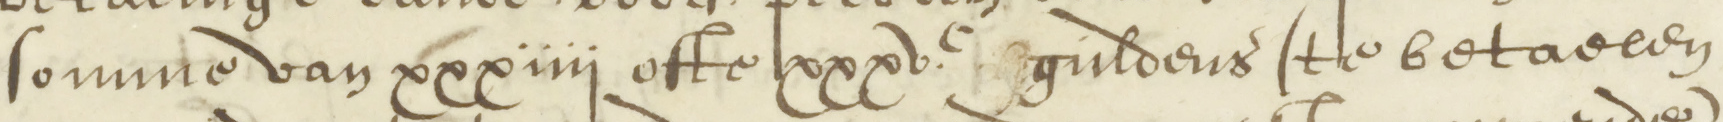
somme van xxxiiij ofte xxxvc. guldens (te betaelen
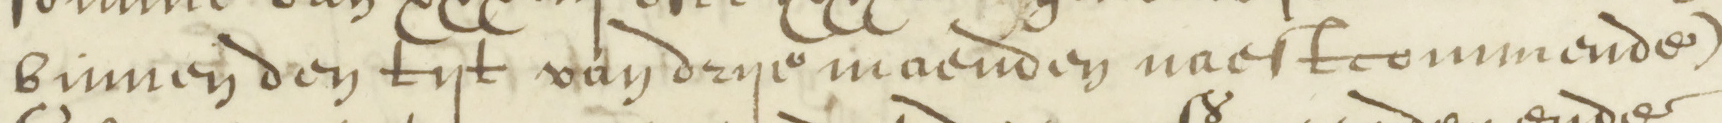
binnen den tyt van drye maenden naestcommende)
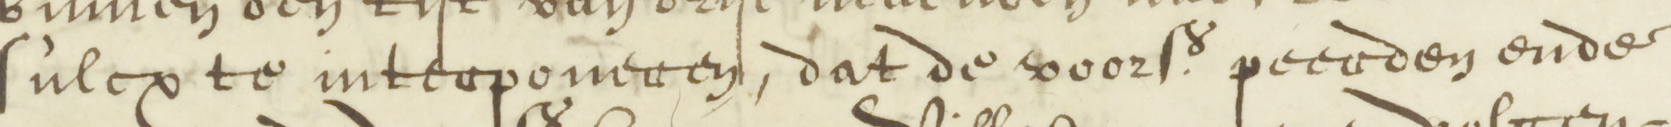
sulcx te interponeren, dat de voors. peerden ende
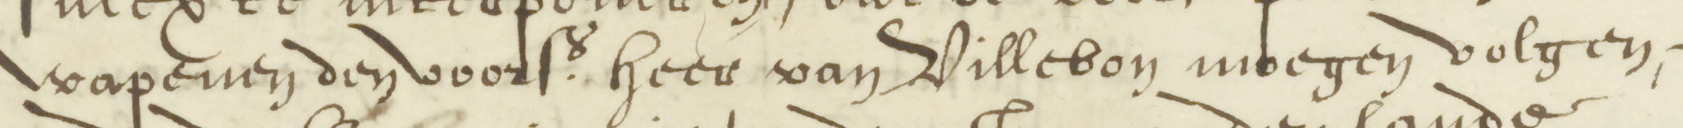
wapenen den voors. heer van Villebon moegen volgen,
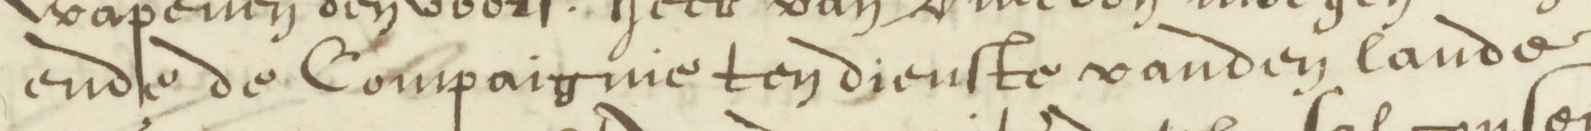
ende de Compaignie ten dienste vanden lande
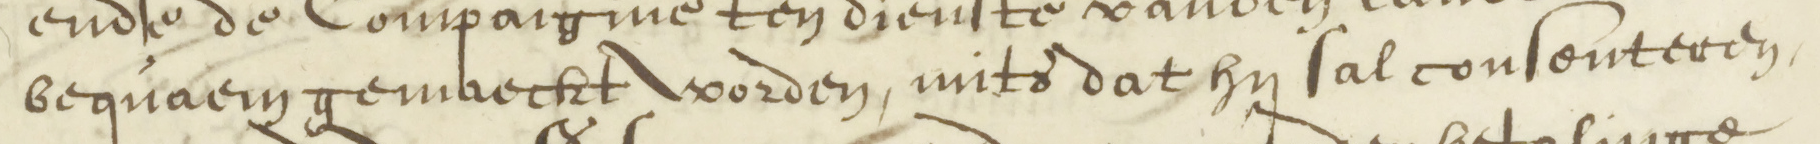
bequaem gemaeckt worden, mits dat hy sal consenteren
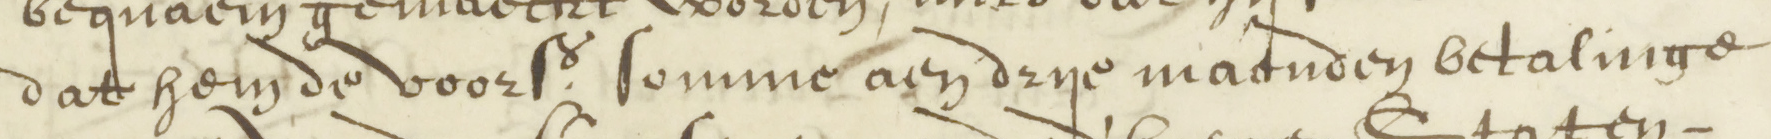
dat hem de voors. somme aen drye maenden betalinge
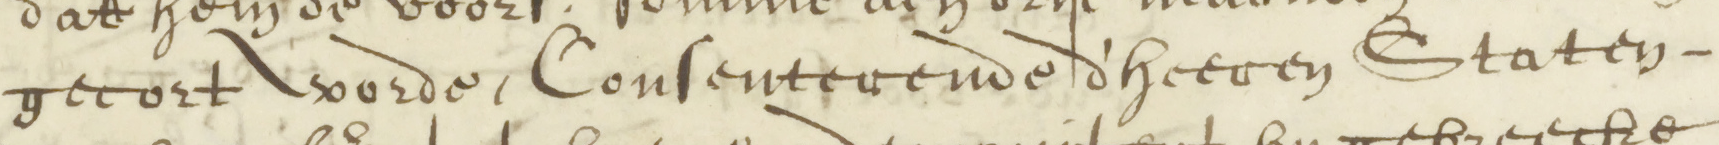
gecort worde, Consenterende d'heeren Staten
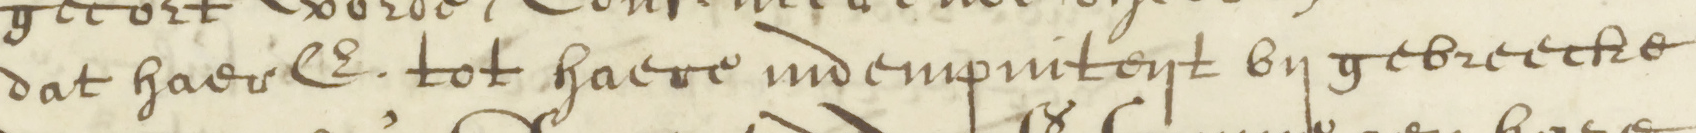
dat haer E. tot haere indempniteyt bij gebreecke
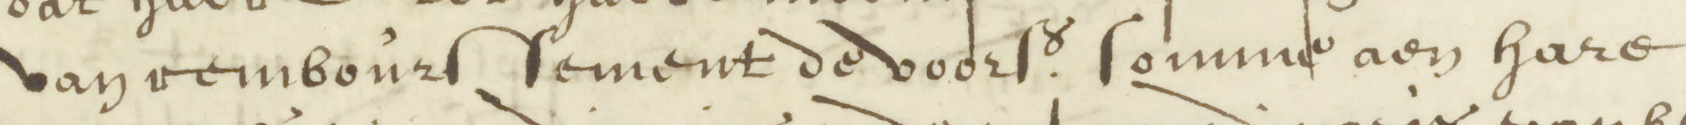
van rembourssement de voors. somme aen hare
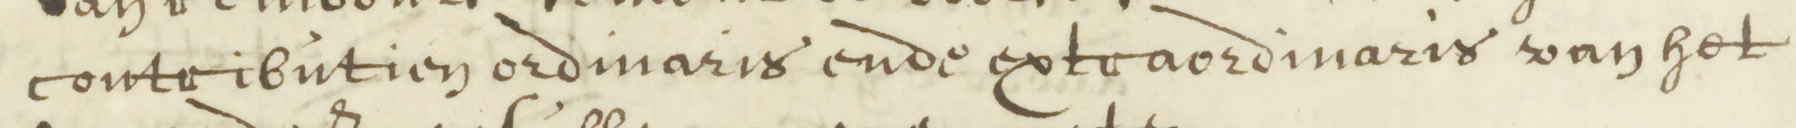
contributien ordinaris ende extraordinaris van het
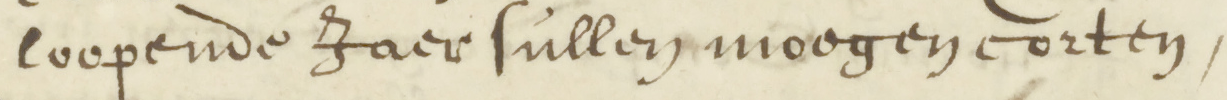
loopende jaer sullen moogen corten.
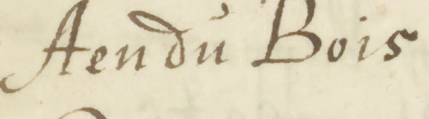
Aen du Bois
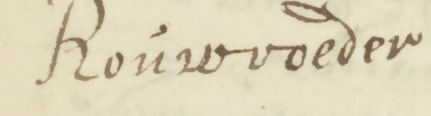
Rouwvoeder
